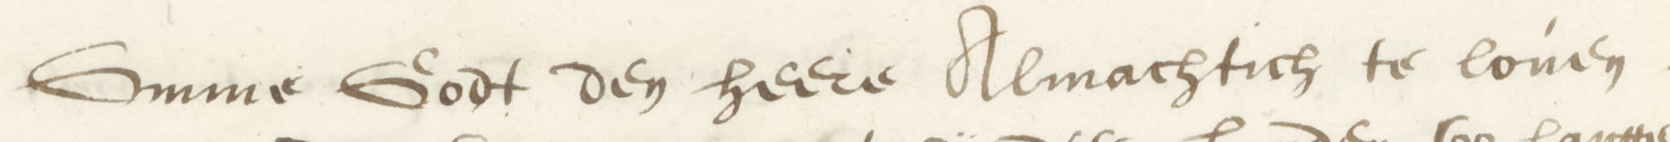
Omme Godt den heere Almachtich te louen
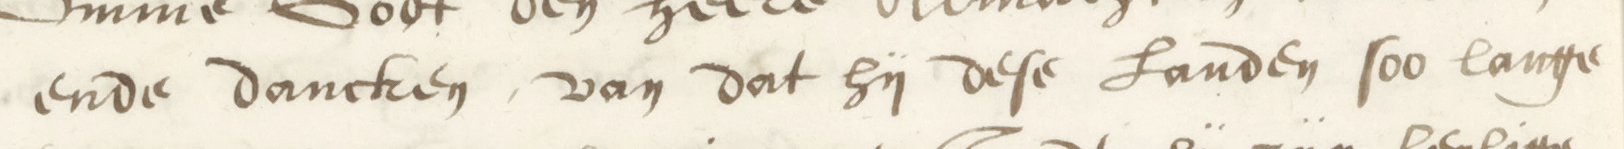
ende dancken, van dat hij dese Landen soo lange
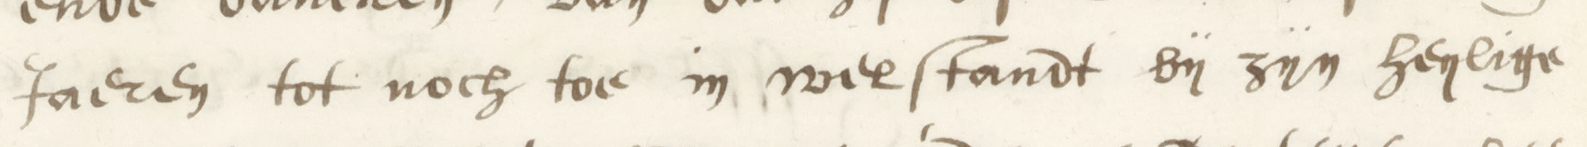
Jaeren tot noch toe in welstandt bij zijn heylige
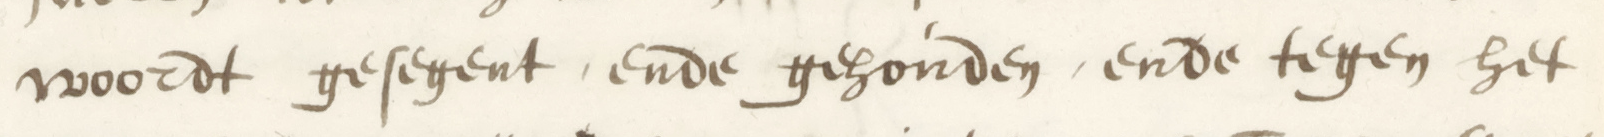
woordt gesegent, ende gehouden, ende tegen het
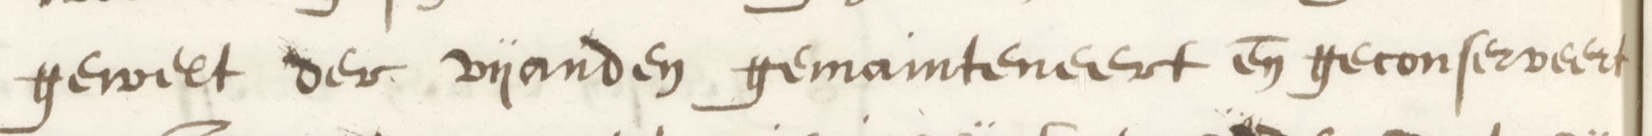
gewelt der vijanden gemainteneert en geconserveert
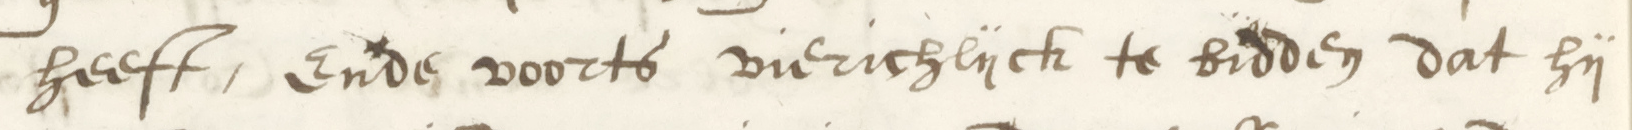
heeft, Ende voorts vierichlijck te bidden dat hij
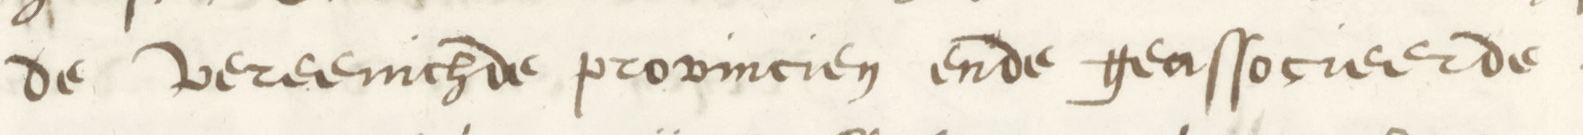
de vereenichde provincien ende geassocieerde
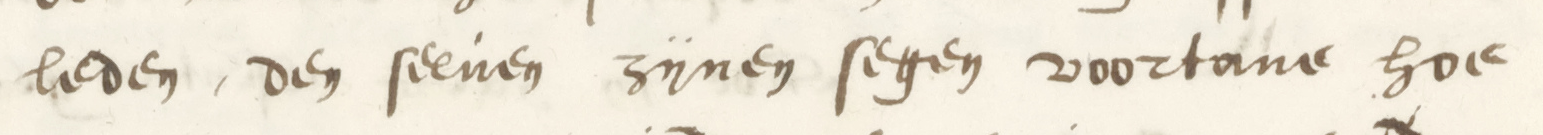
leden, den seluen zijnen segen voortane hoe
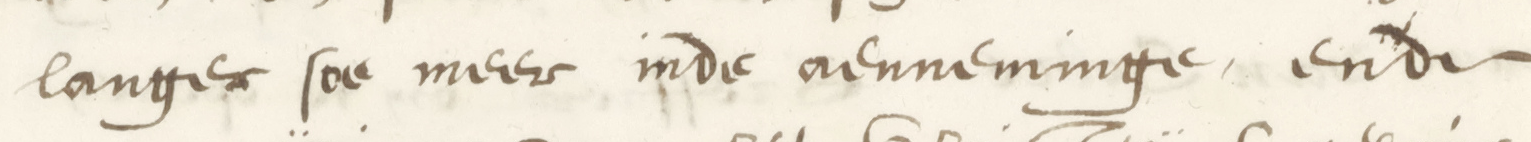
langer soe meer inde aenneminge, ende
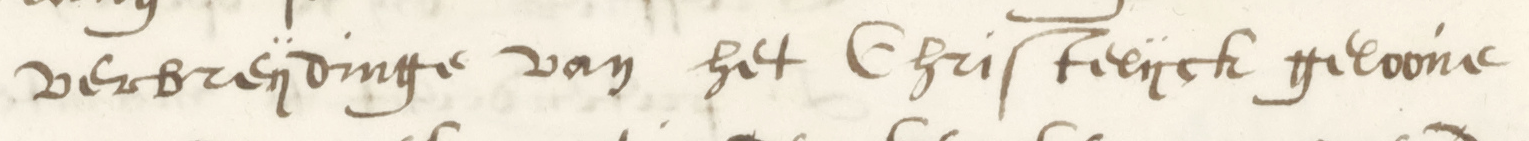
verbreijdinge van het Christelijck gelooue
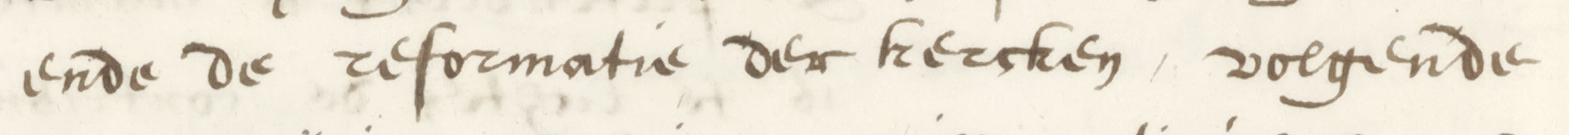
ende de reformatie der kercken, volgende
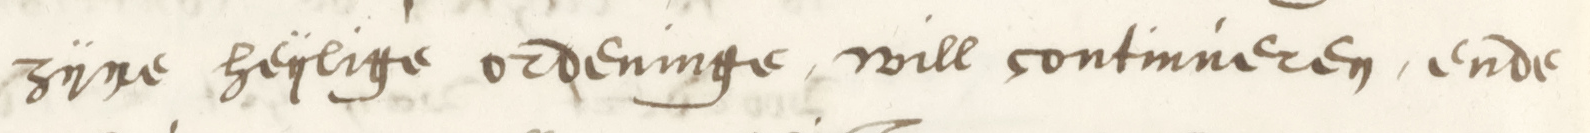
zijne heijlige ordeninge, will continueren, ende
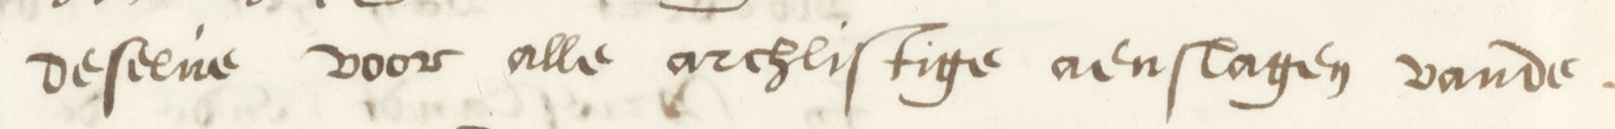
deselue voor alle archlistige aenslagen vande
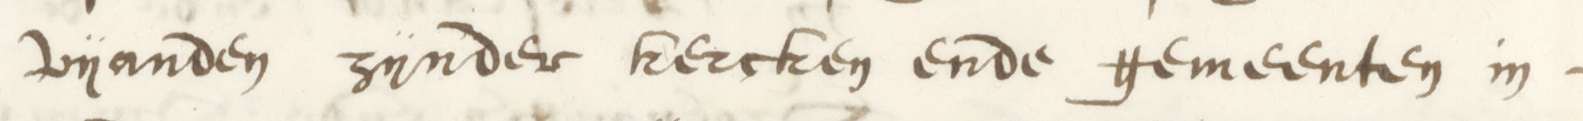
vijanden zijnder kercken ende gemeenten in
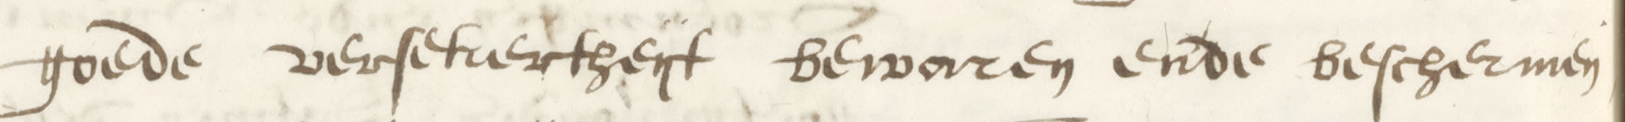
goede versekertheyt bewaren ende beschermen
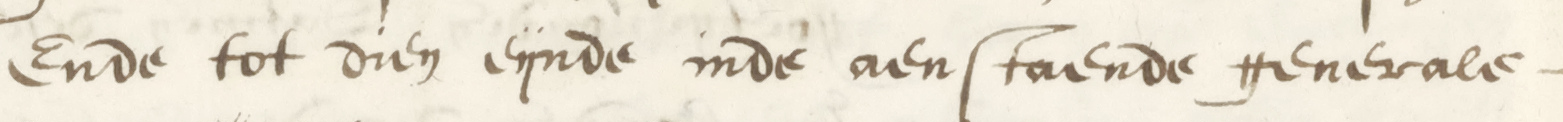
Ende tot dien eijnde inde aenstaende generale
